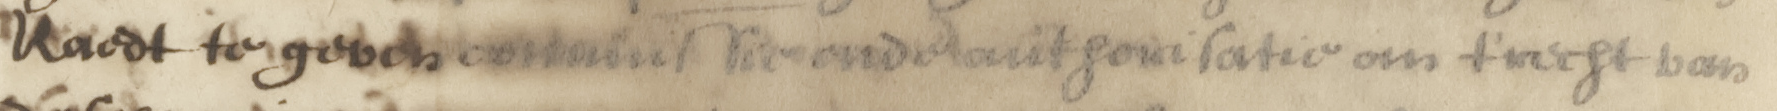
Raedt te geven commissie ende authorisatie om t'recht van
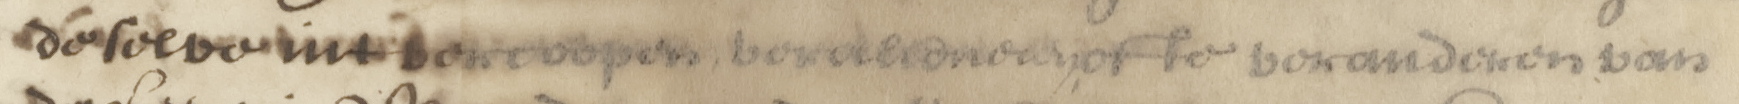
de selve int vercoopen, verleenen, ofte veranderen van
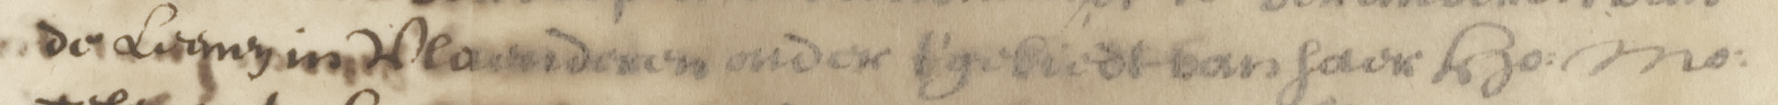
de Leenen in Vlaenderen onder t'gebiet van haer Ho:Mo:
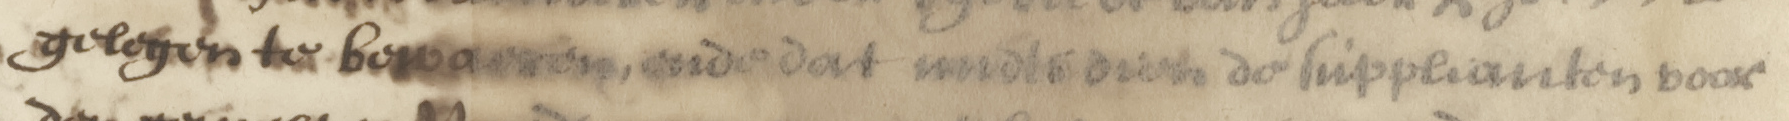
gelegen te bewaeren, ende dat midtsdien de supplianten voor
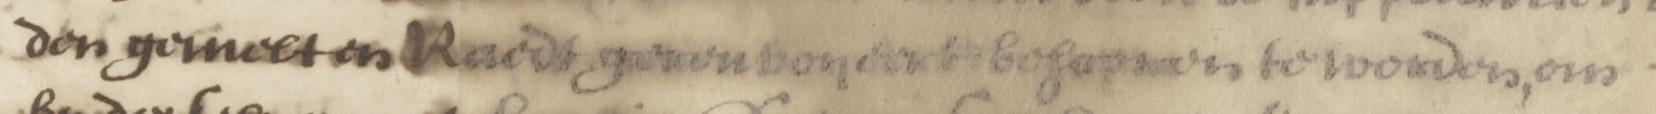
den gemelten Raedt gerenvoyeert behooren te worden, om
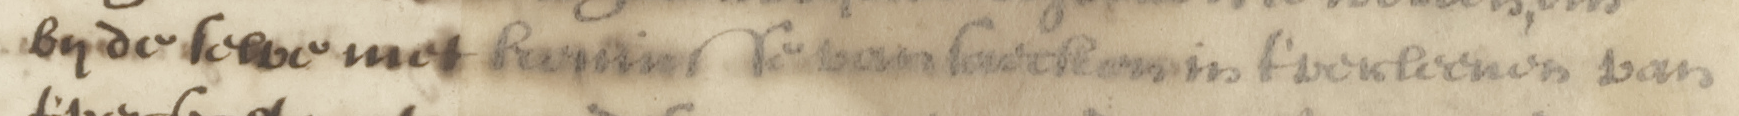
by de selve met kennisse van saecken in t'verleenen van
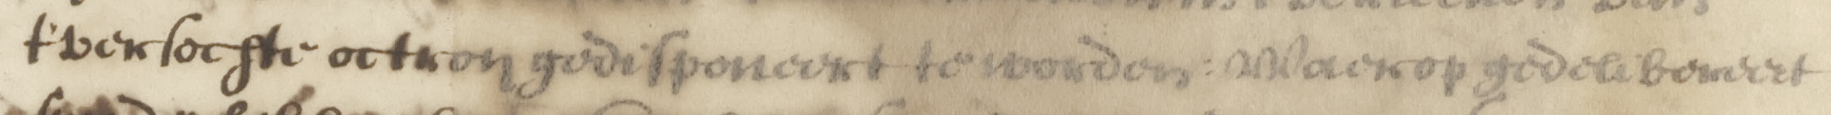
t'versochte octroy gedisponeert te worden: Waerop gedelibereert
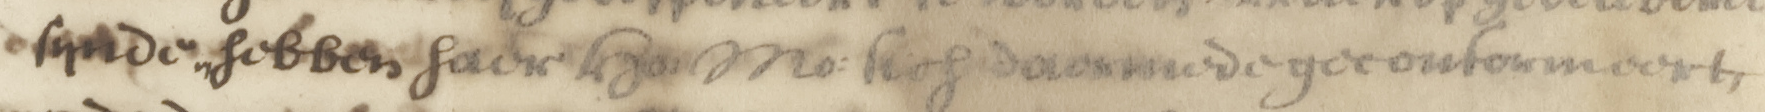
synde, hebben haer Ho:Mo: sich daermede geconformeert,
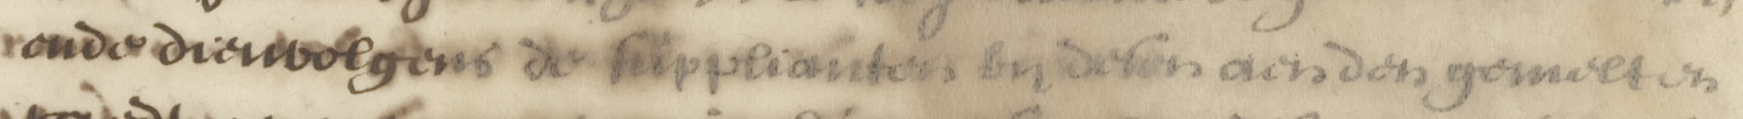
ende dienvolgens de supplianten by desen aen den gemelten
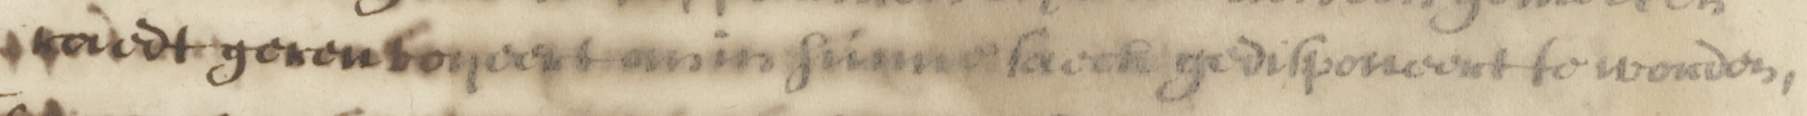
raedt gerenvoyeert om in hunne saeck gedisponeert te worden.
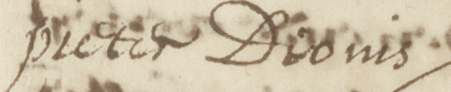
pieter Dionis
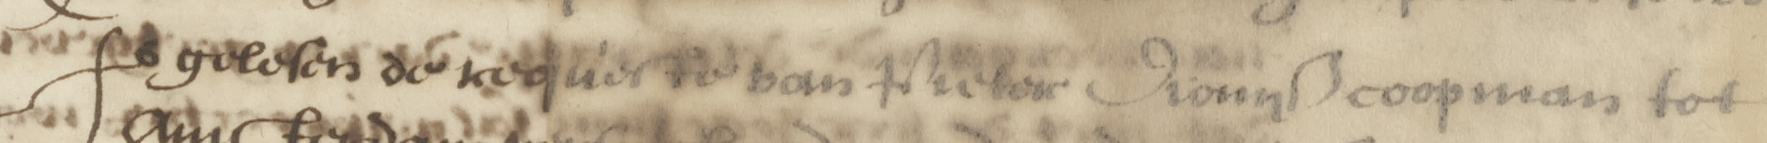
Is gelesen de requeste van Pieter Dionys coopman tot
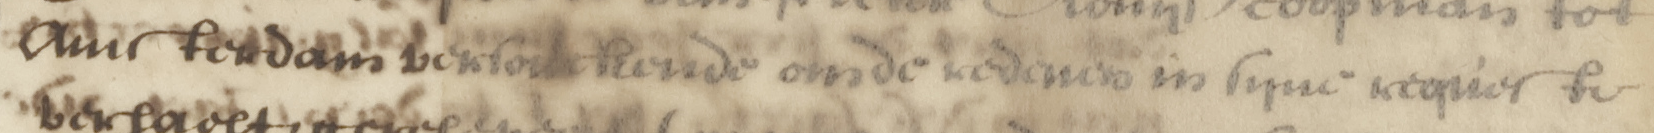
Amsterdam versouckende om de redenen in syne requeste
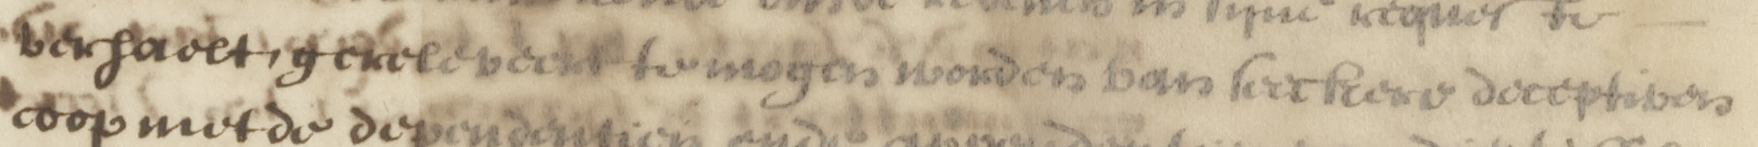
verhaelt, gereleveert te mogen worden van seeckere deceptiven
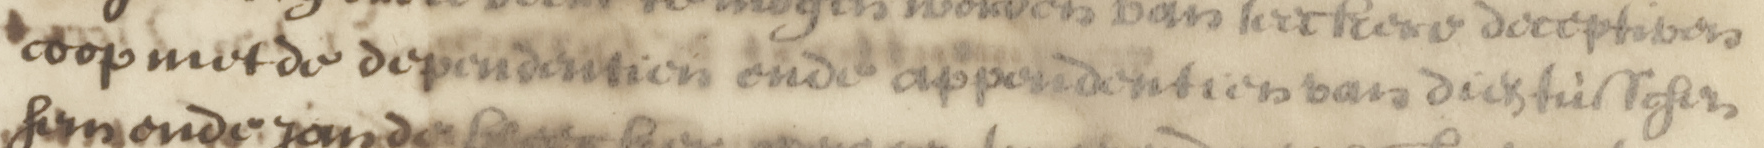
coop met de dependentien ende appendentien van dien tusschen
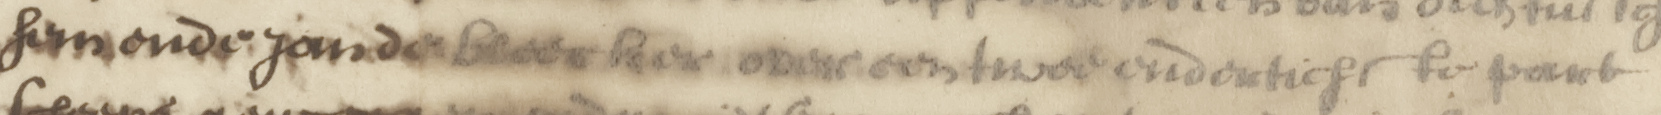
hem ende Jan de bleecker over een tweeendertichste part
